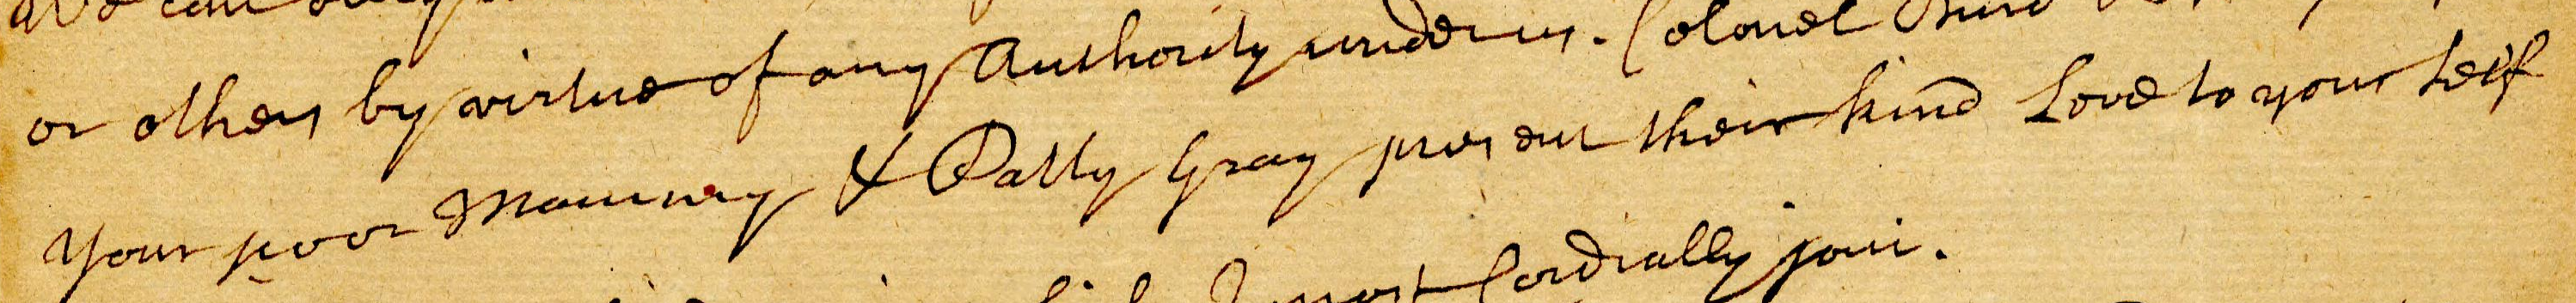Your poor Mammy & Pally Gray send out their kind Love to your self
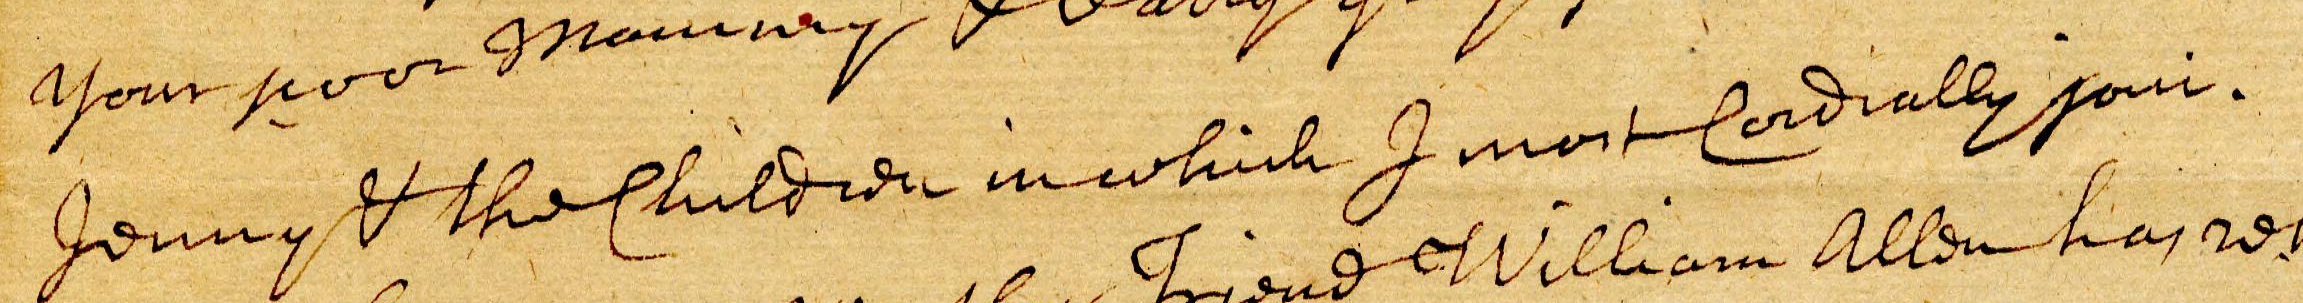Jonny & the Children in which I most Cordially join.
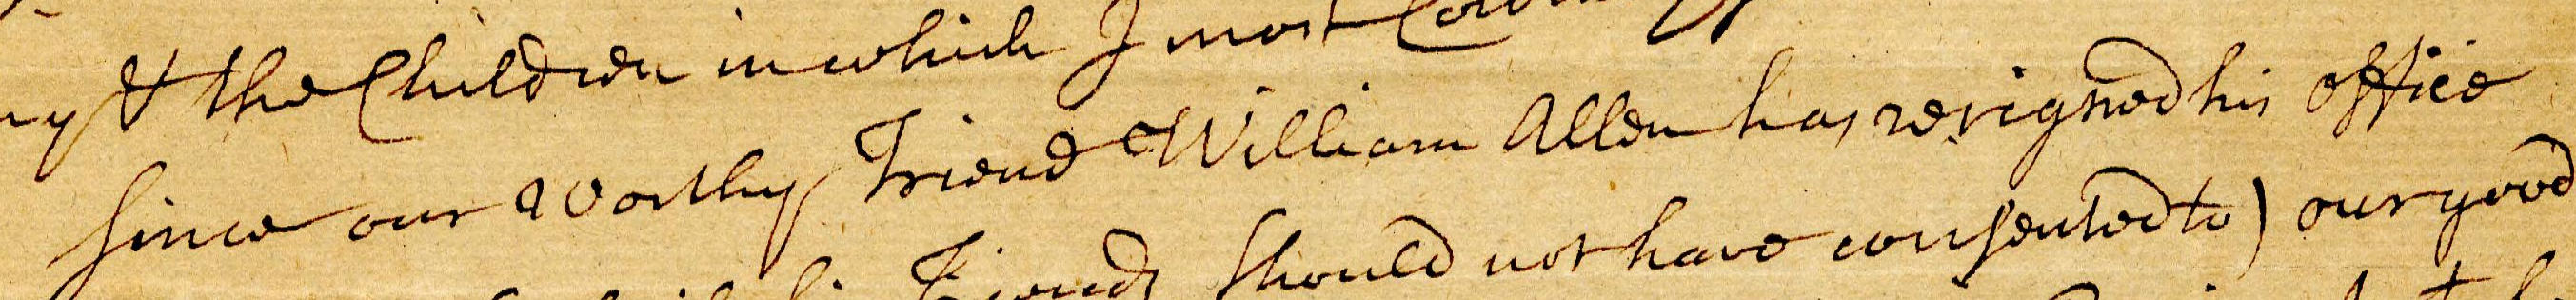Since our Worthy Friend William Allen has resigned his office
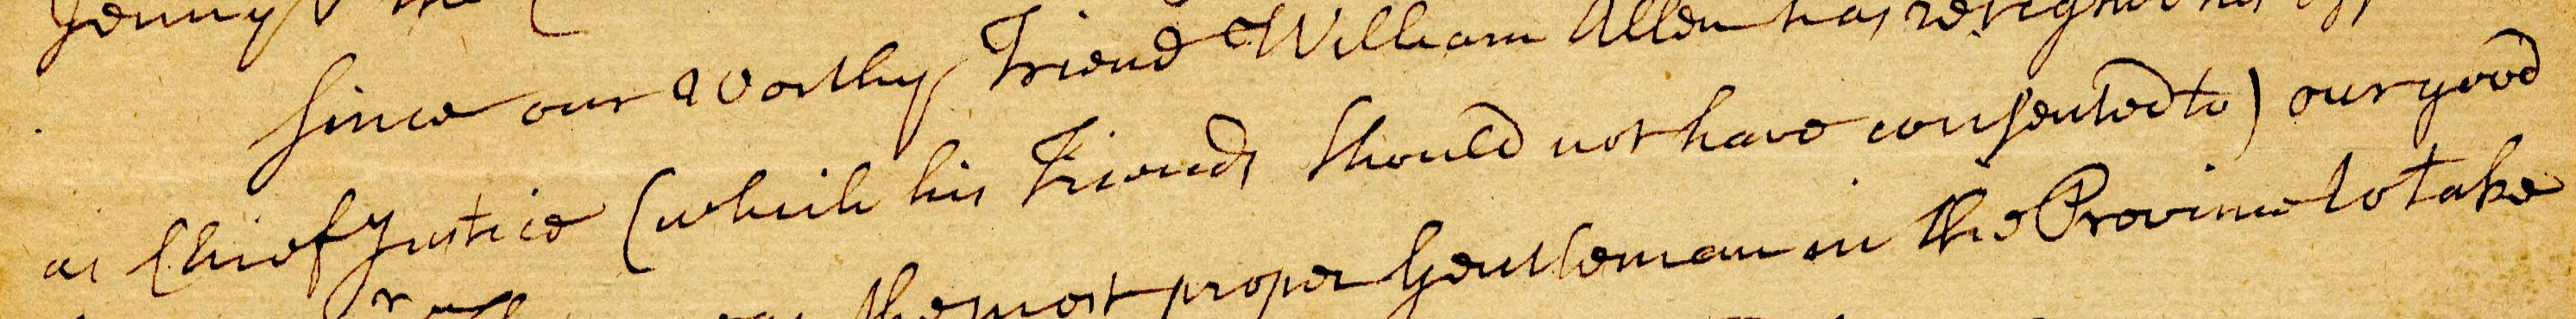as Chief Justice (which his Friends should not have consented to) our good
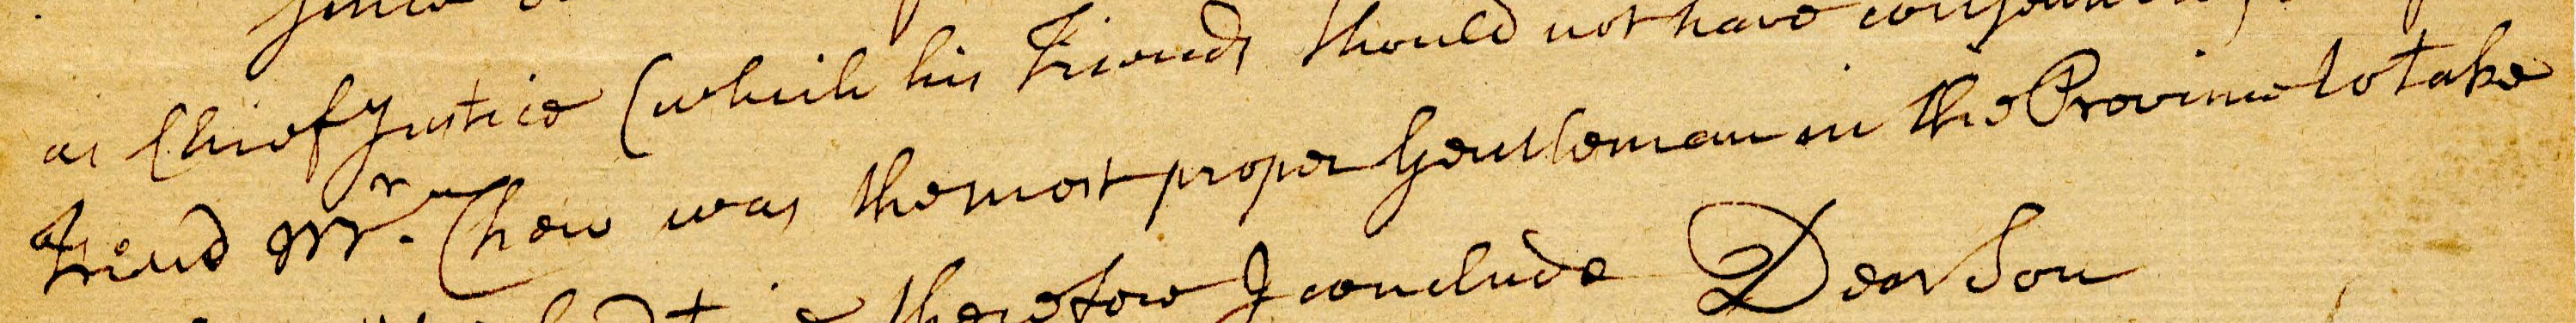friend M^r Chew was the most proper Gentleman in the Province to take
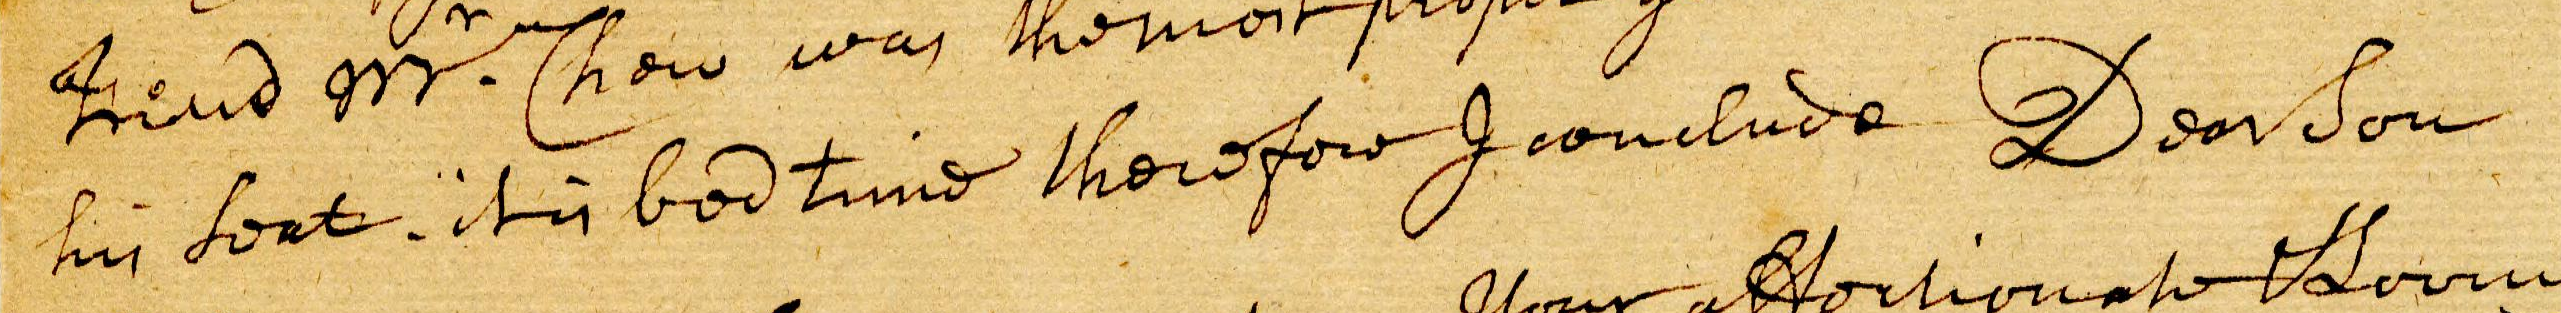his seat. it is bed time therefore I conclude Dear Son
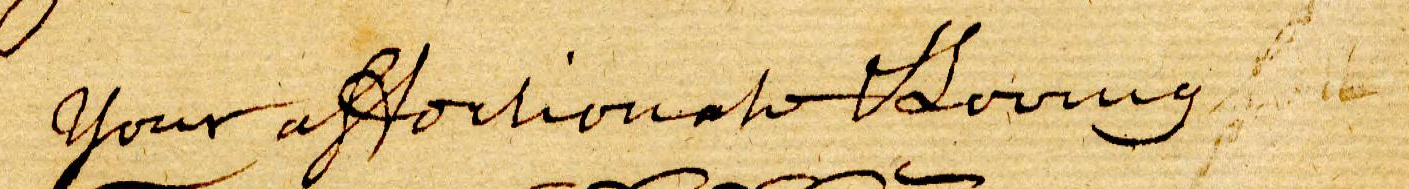Your affectionate & Loving
